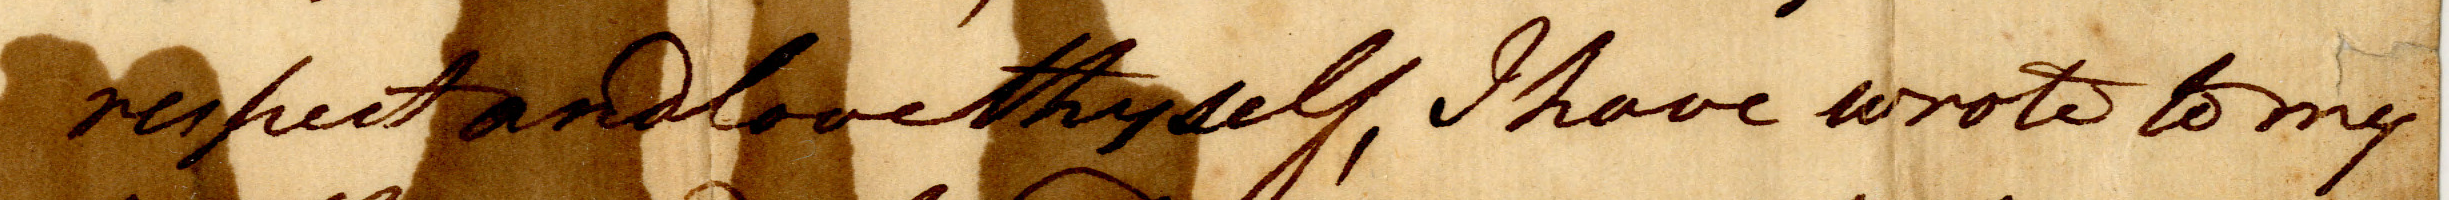respect and love thyself, I have wrote to my
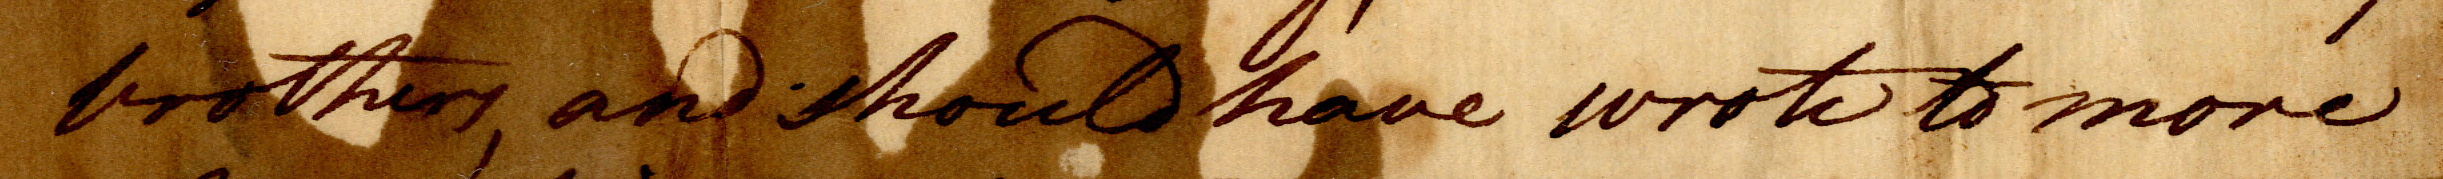brothers, and should have wrote to more
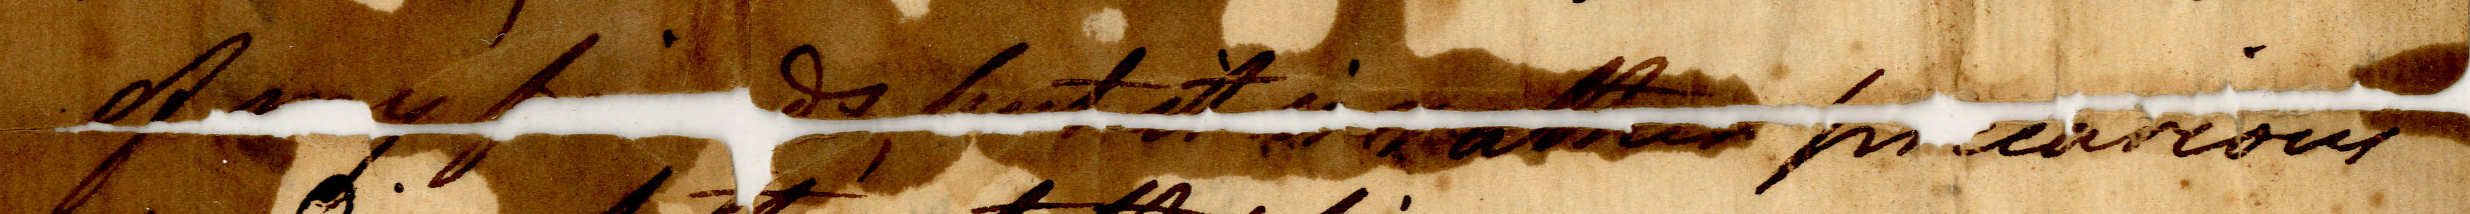of my friends, but it is rather precarious
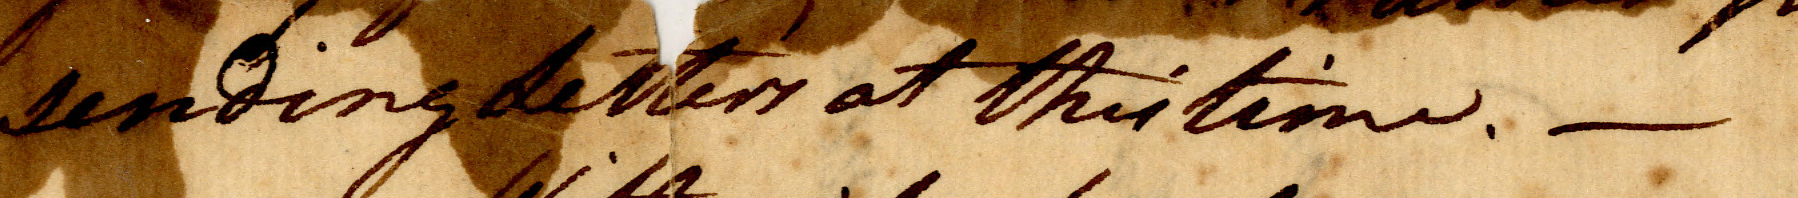sending Letters at this time.-
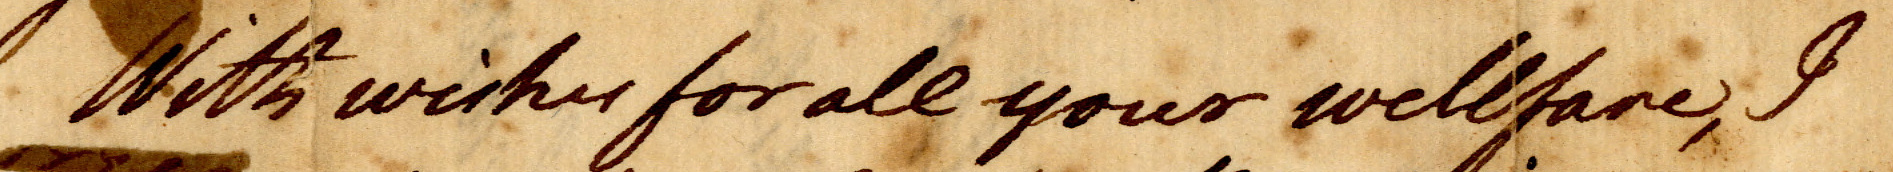With wishes for all your welfare, I
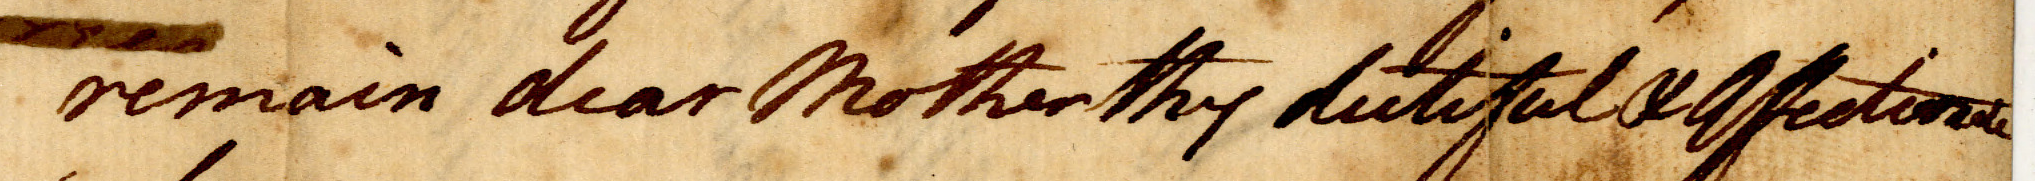remain dear Mother thy dutiful & Affectionate
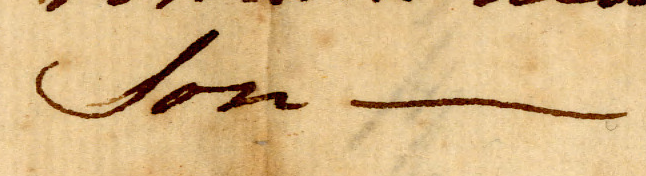Son-
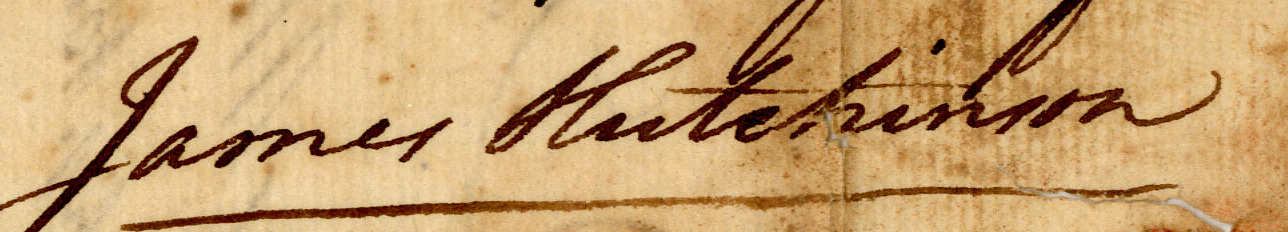James Hutchinson
